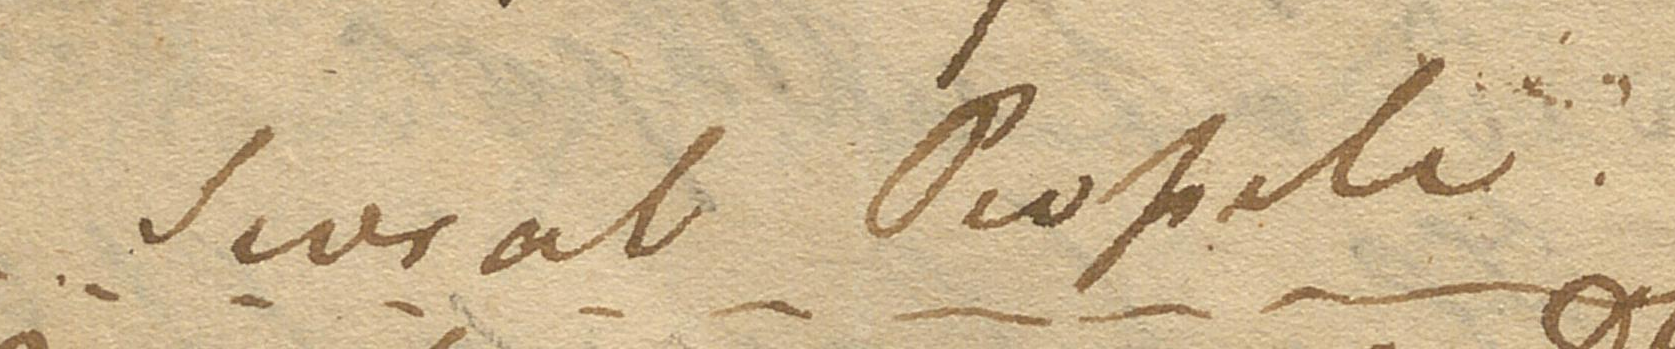sevral Peopele
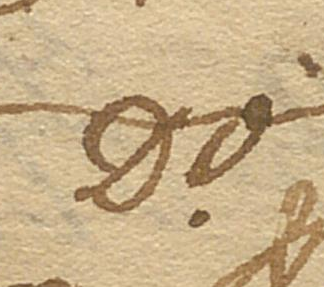D^o.
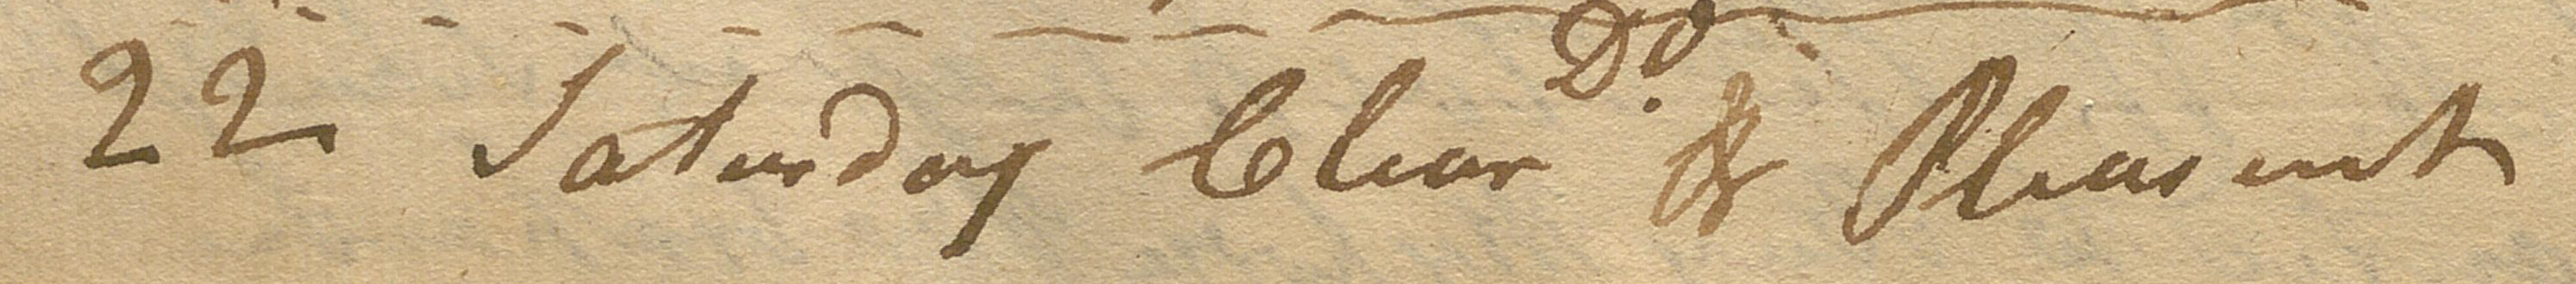22 Saturday Clear & Pleasent
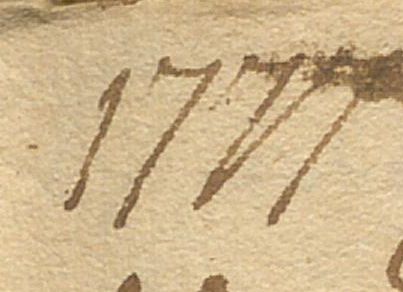1777
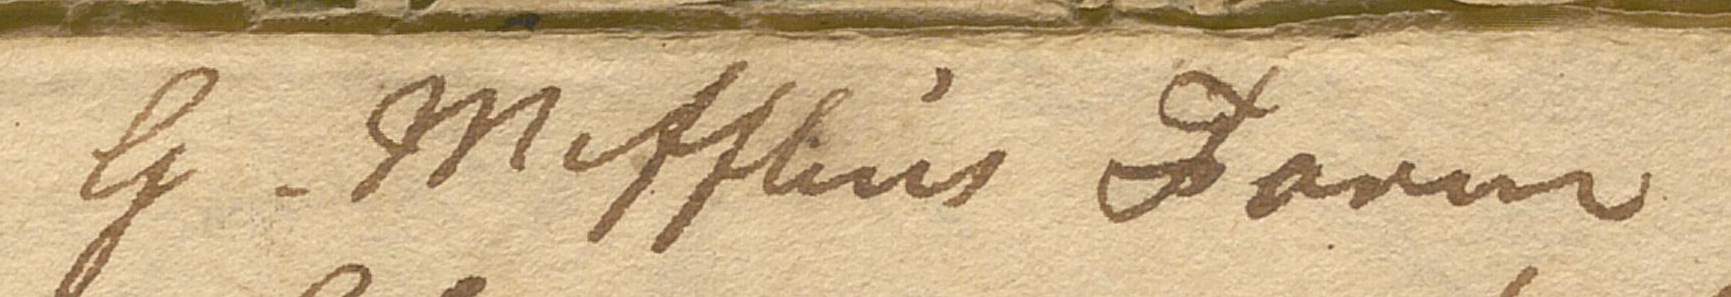Gl. Mifflins Farm
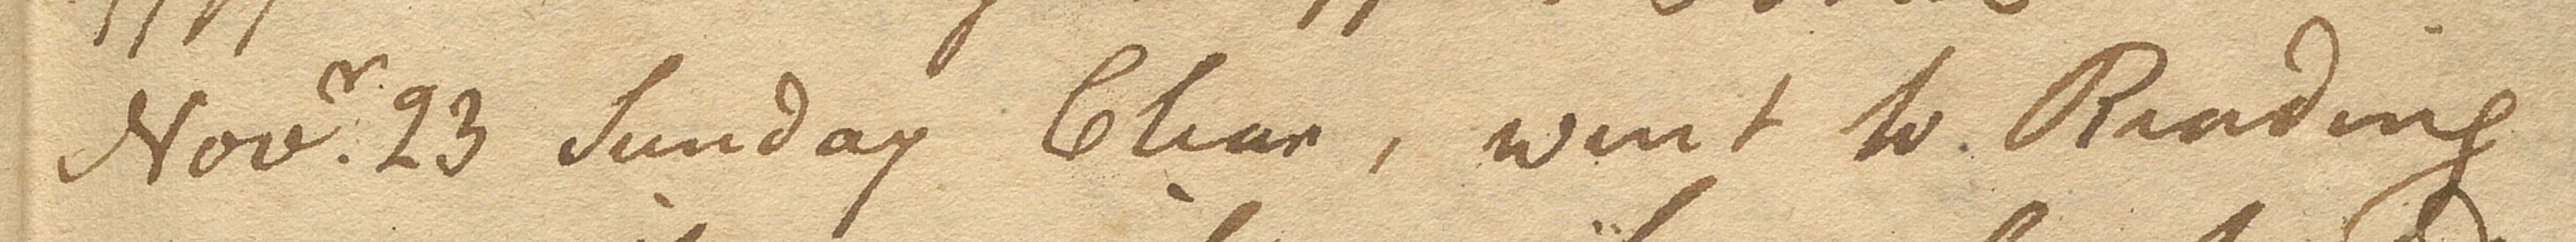Nov^r. 23 Sunday Clear, went to Reading
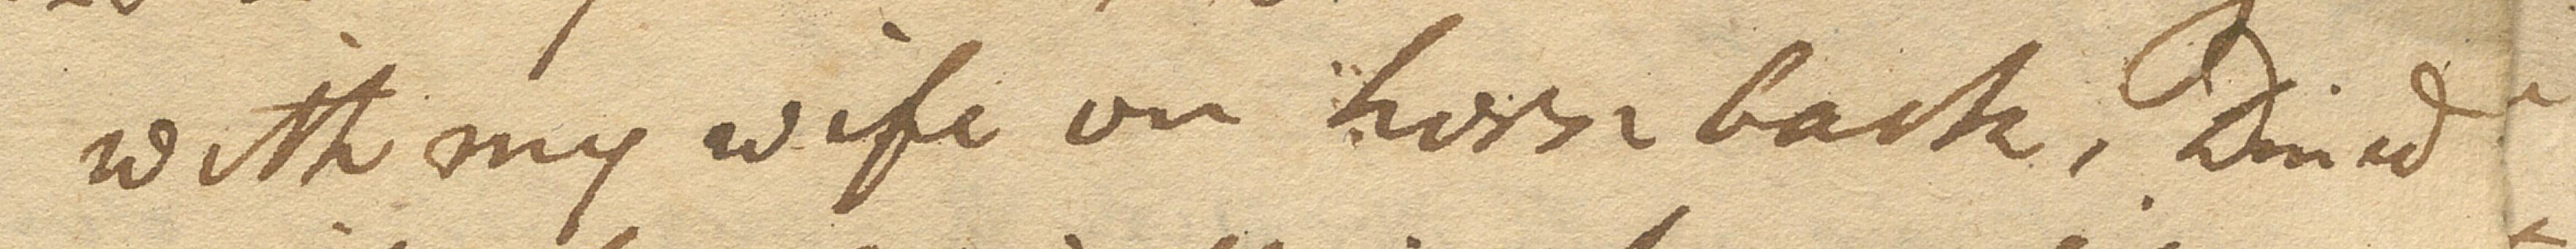with my wife on horse back, Dined
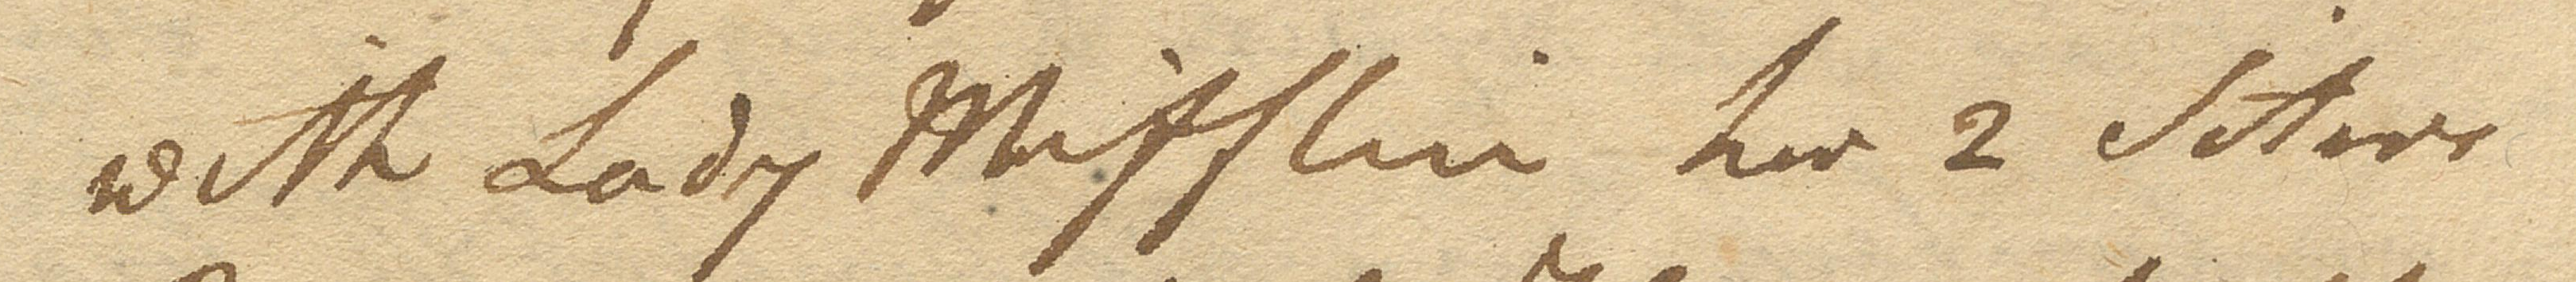with Lady Mifflin her 2 Sisters
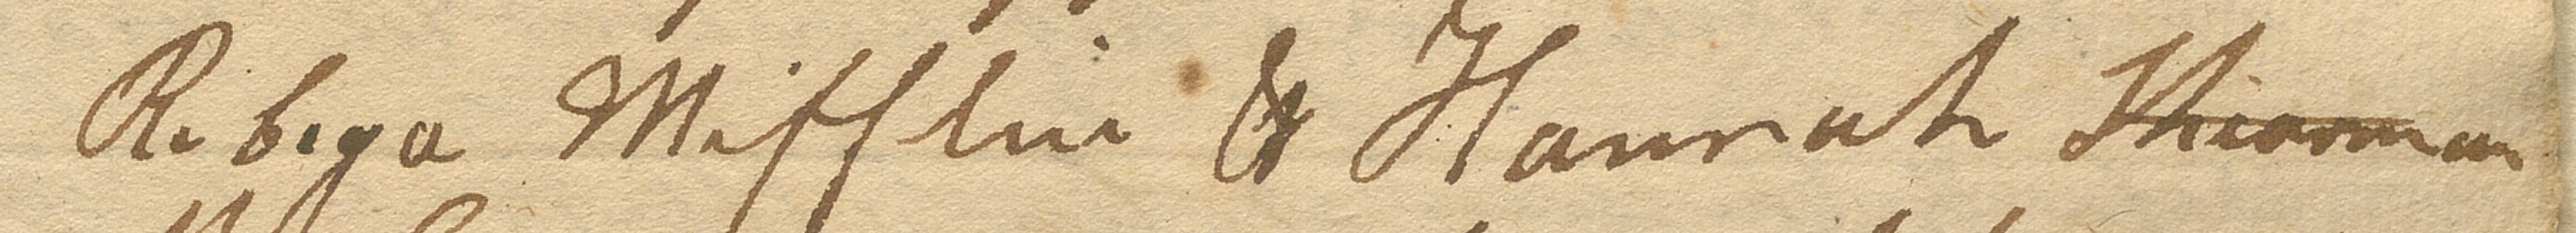Rebiga Mifflin & Hannah Sheanman
